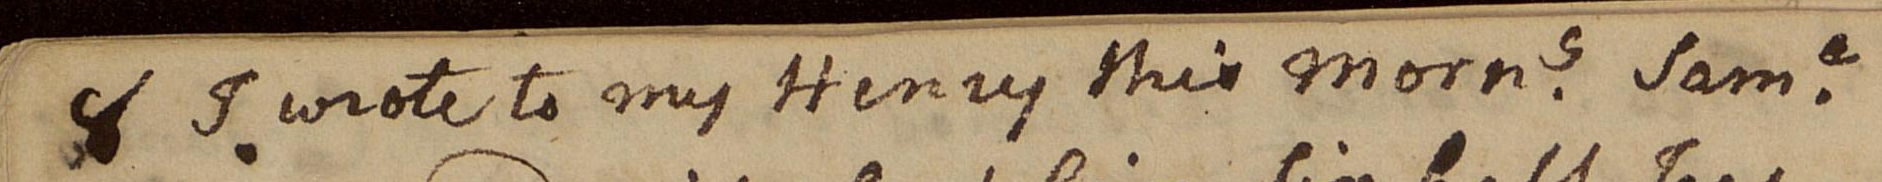8 I wrote to my Henry this morn^g. Sam^l.
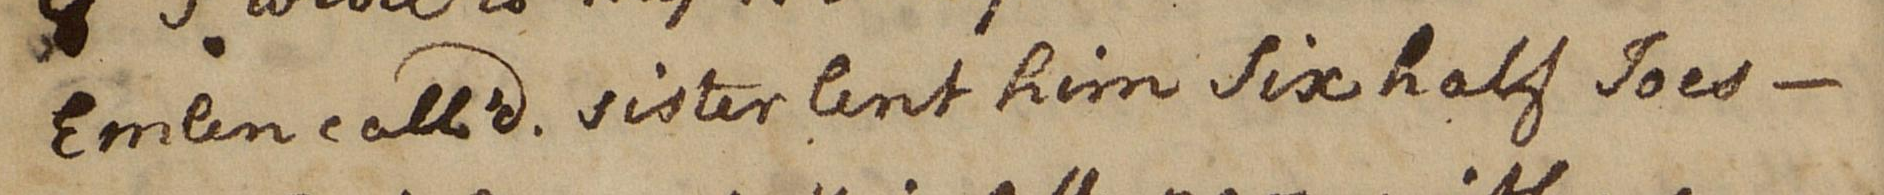Emlen call'd sister lent him Six half Joes-
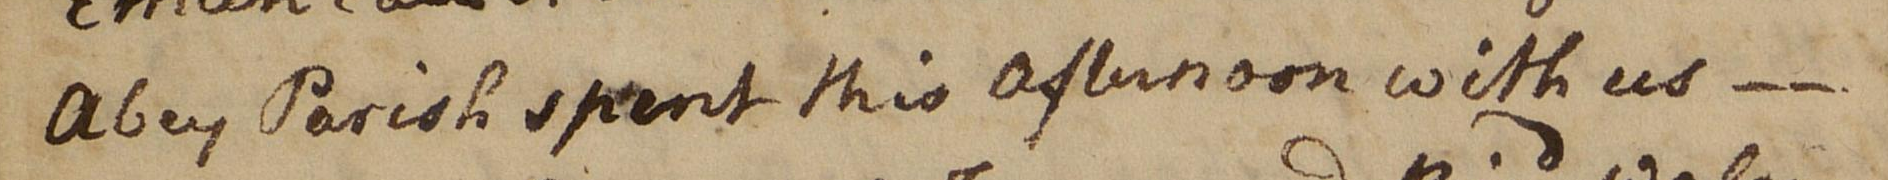Abey Parish spent this afternoon with us-
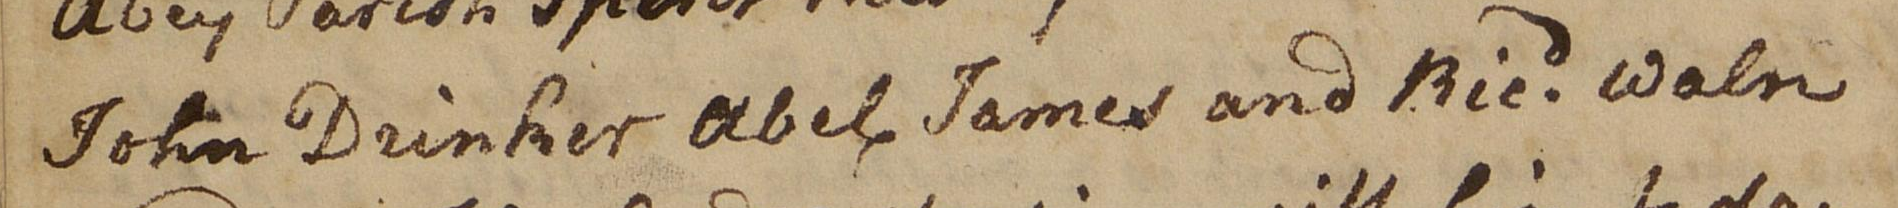John Drinker Abel James and Ric^d. Waln
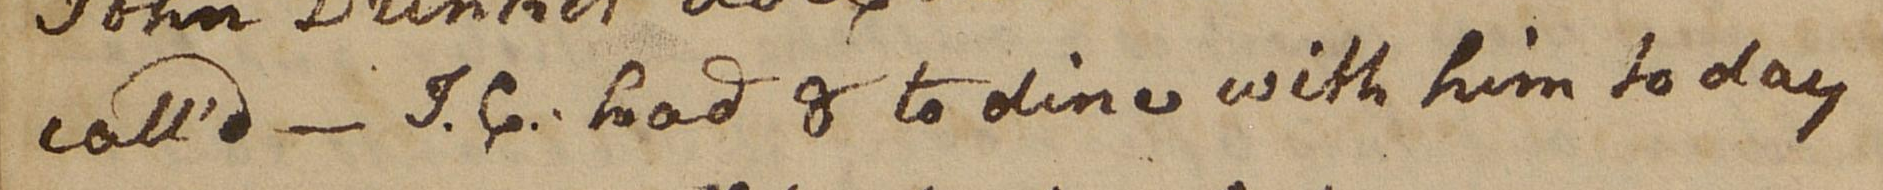call'd- I.C. had 8 to dine with him to day
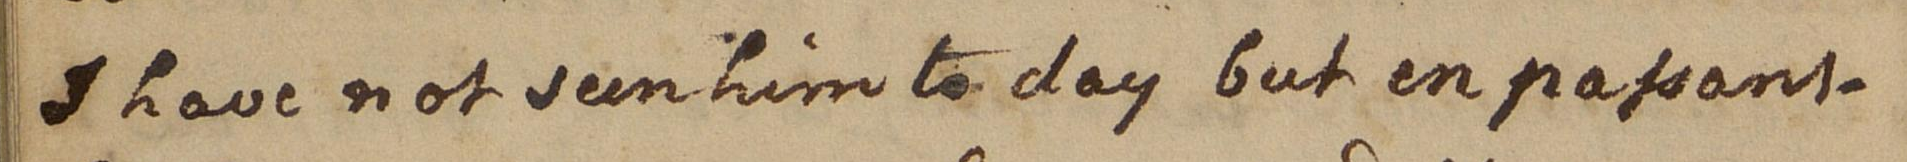I have not seen him to day but en passans-
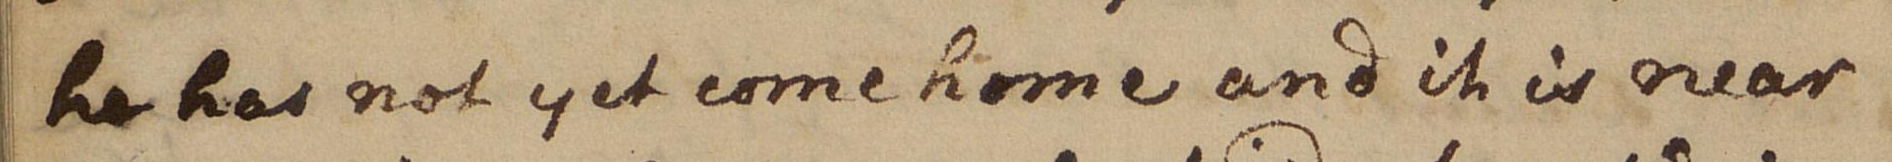he has not yet come home and it is near
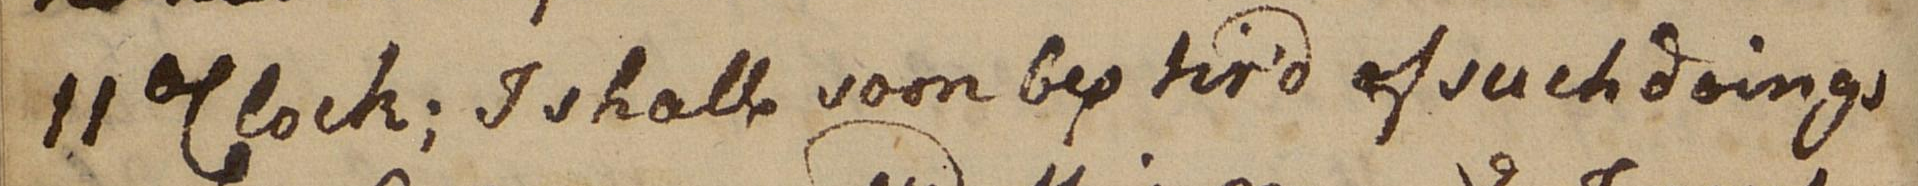11 ^oClock; I shall soon by tir'd of such doings
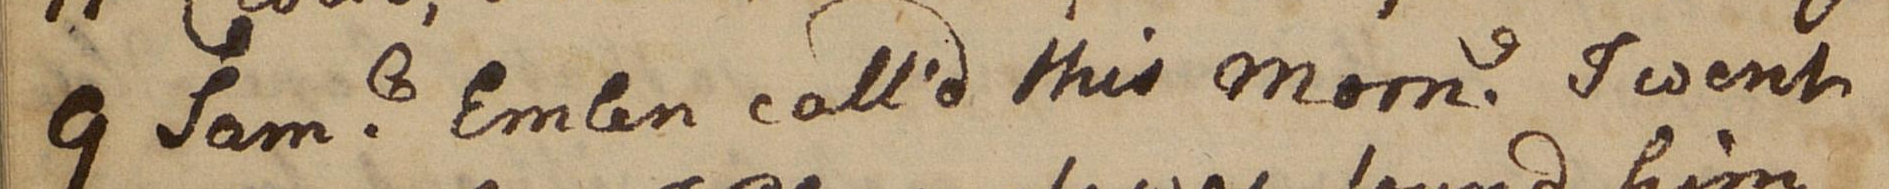9 Sam^l. Emlen call'd this morn^g. I went
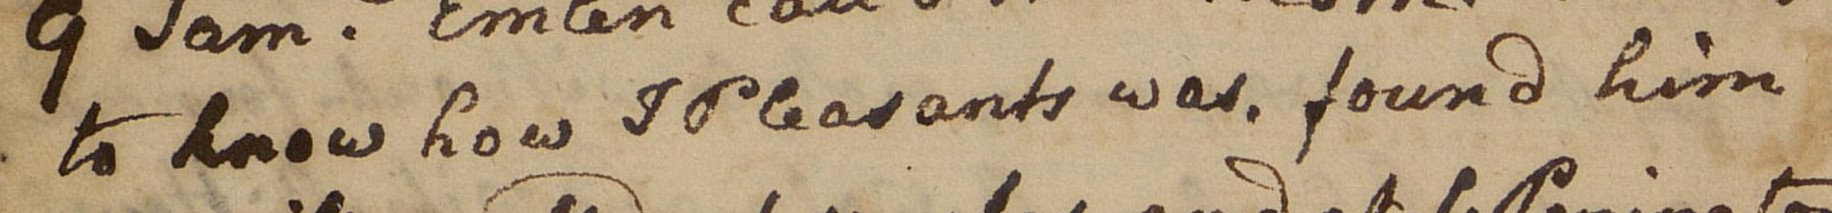to know how S Pleasants was. found him
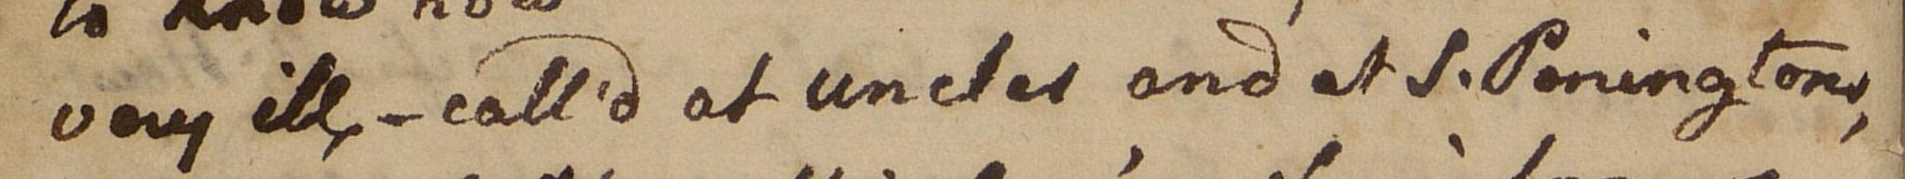very ill- call'd at Uncles and at S. Peningtons,
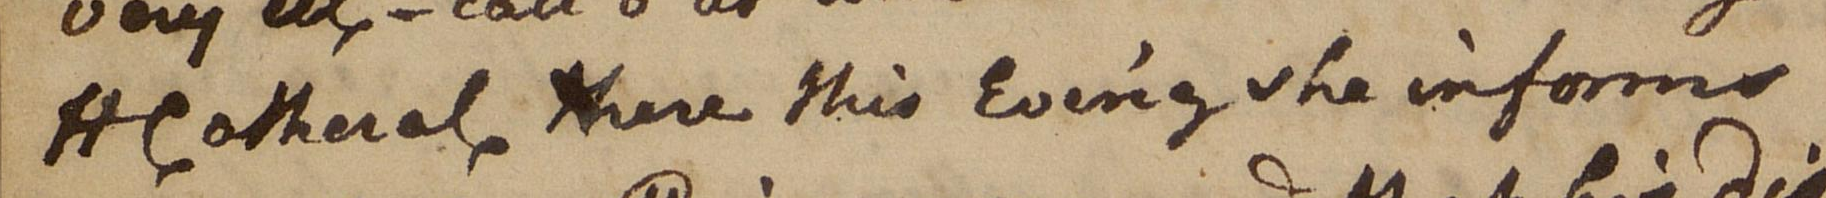H Catheral there this Even'g she informs
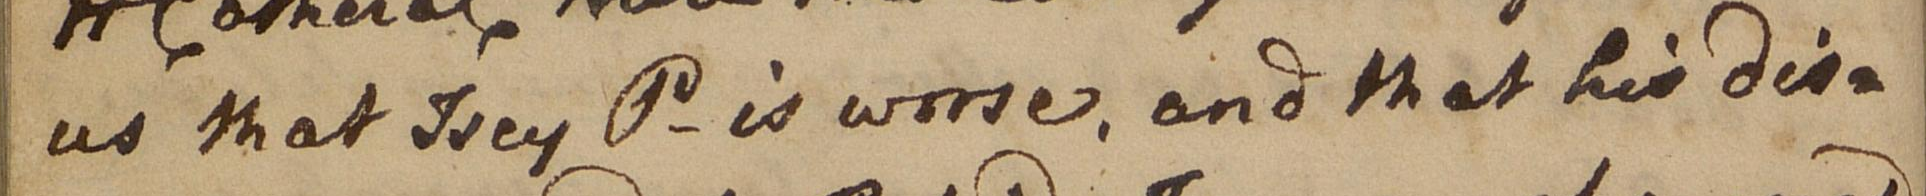us that Jsey P- is worse, and that his dis-
